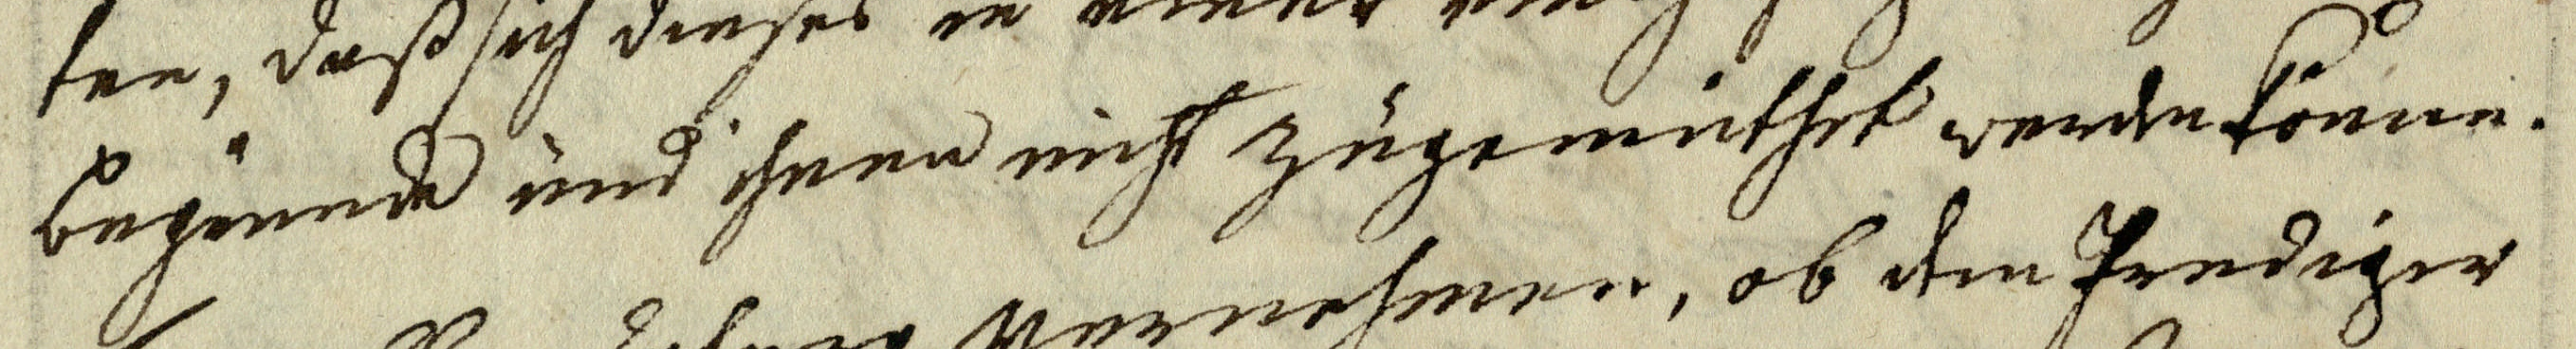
begründe und ihnen nicht zugemuthet werden könne.
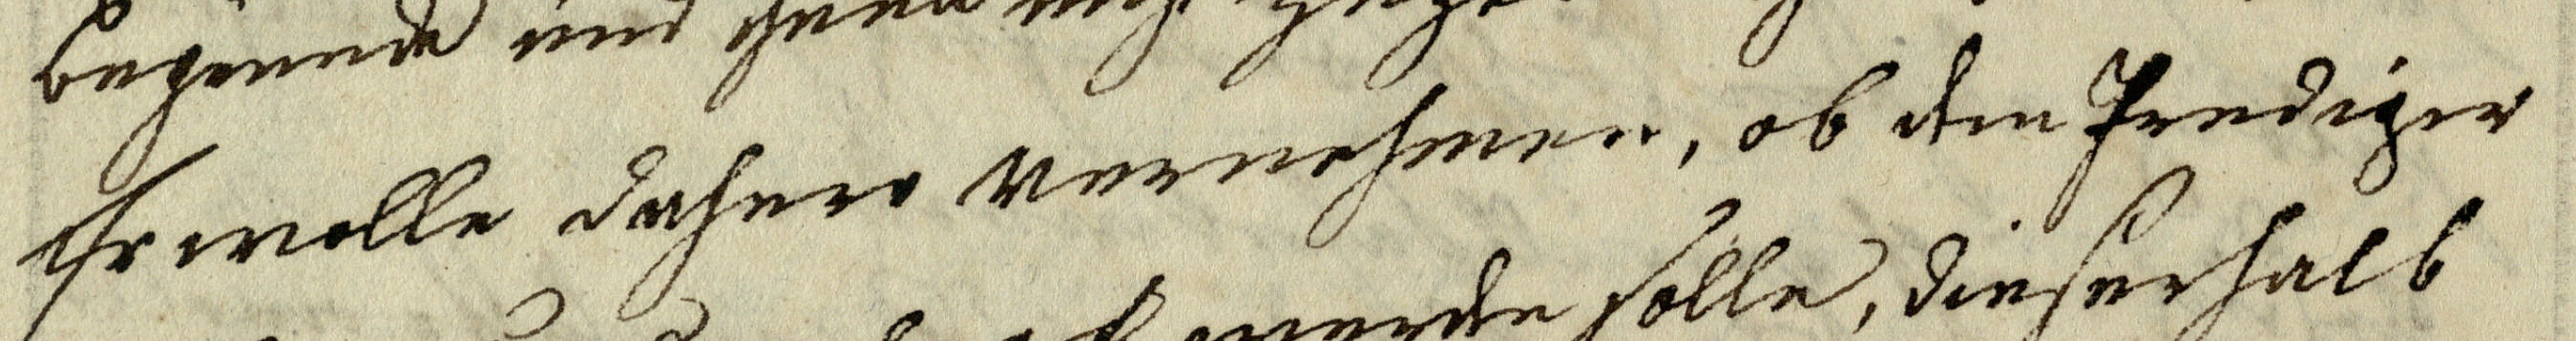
Er wolle dahero vernehmen, ob dem Prediger
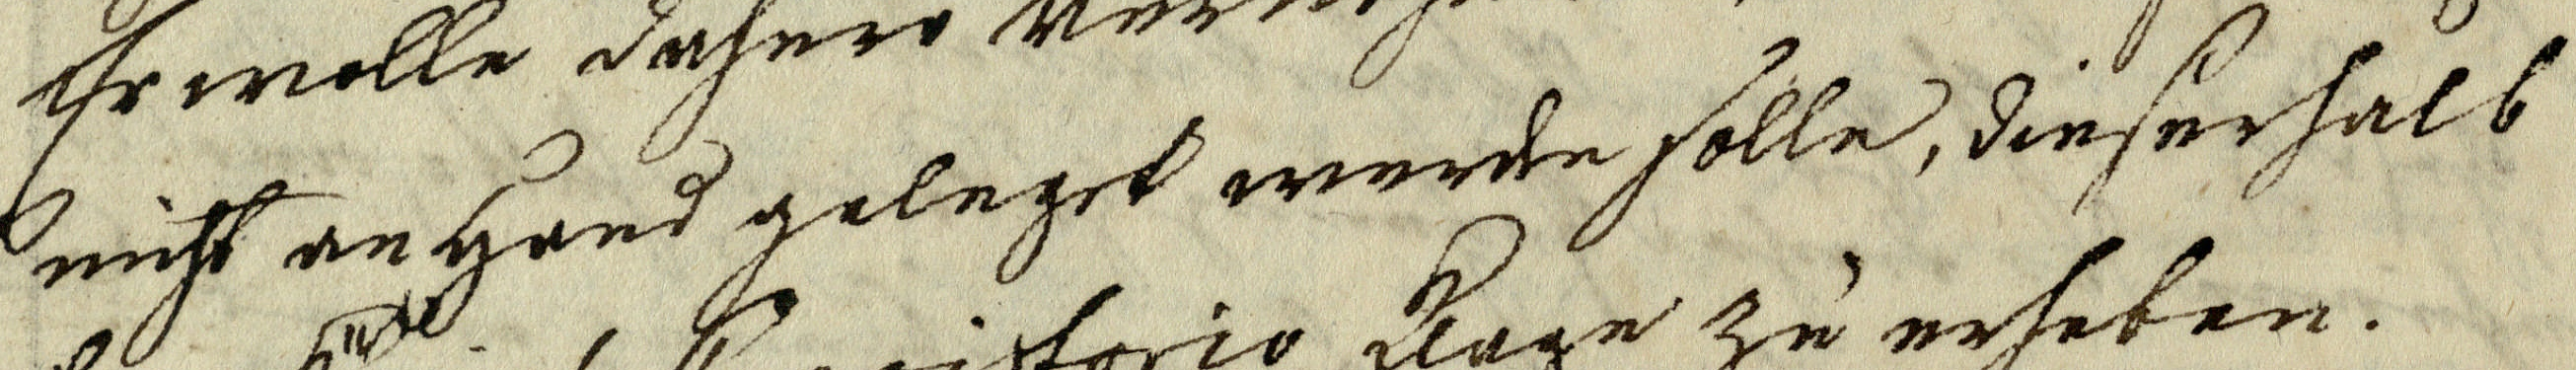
nicht an Hand gelegt werden solle, dieserhalb
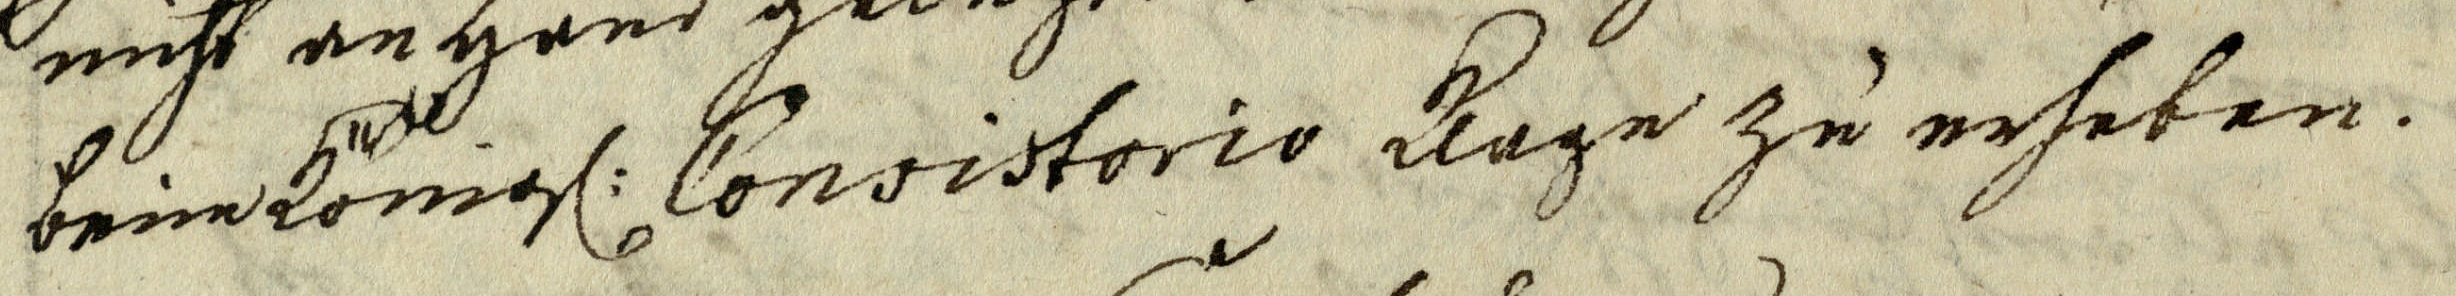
beim Königl. Consistorio Klage zu erheben.
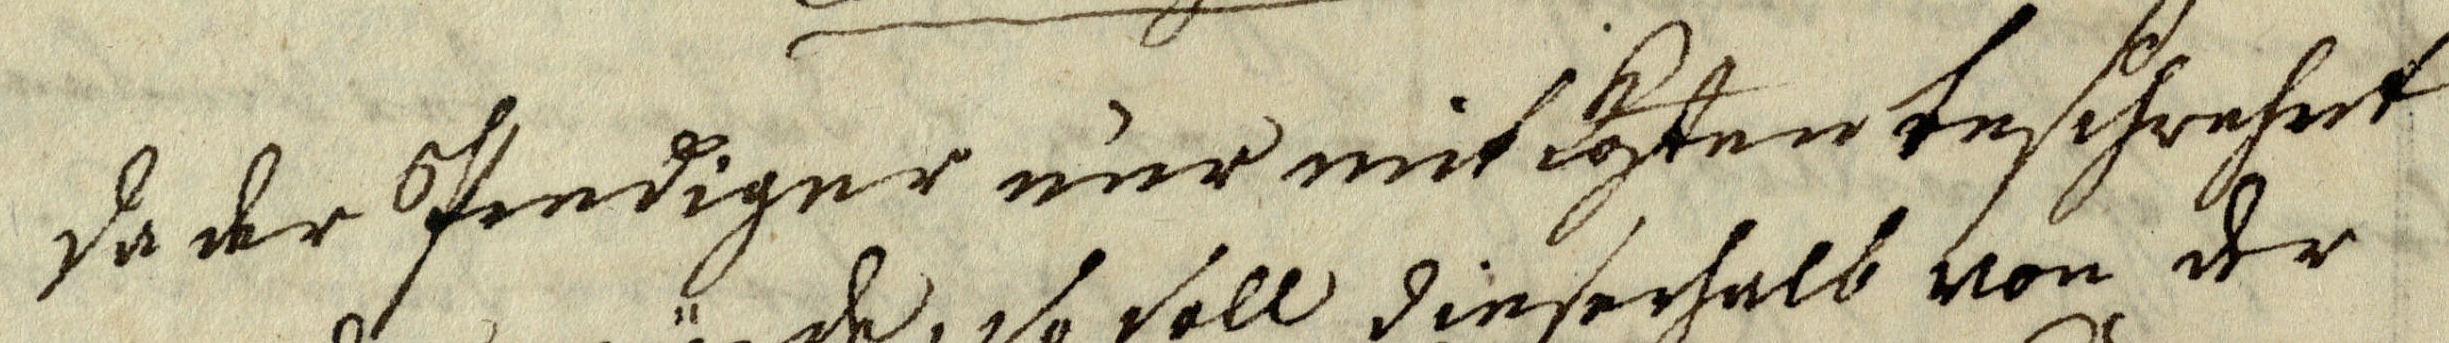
Da der Herr Prediger nur mit Kosten beschwehret
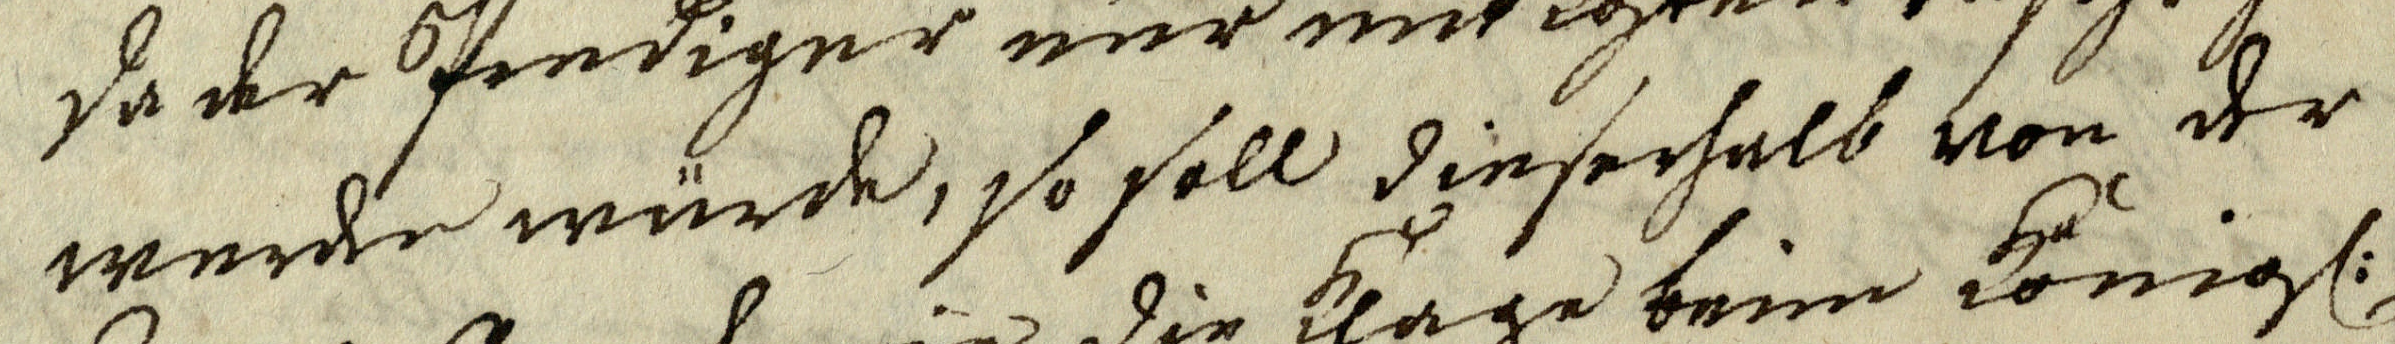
werden würde, so soll dieserhalb von der
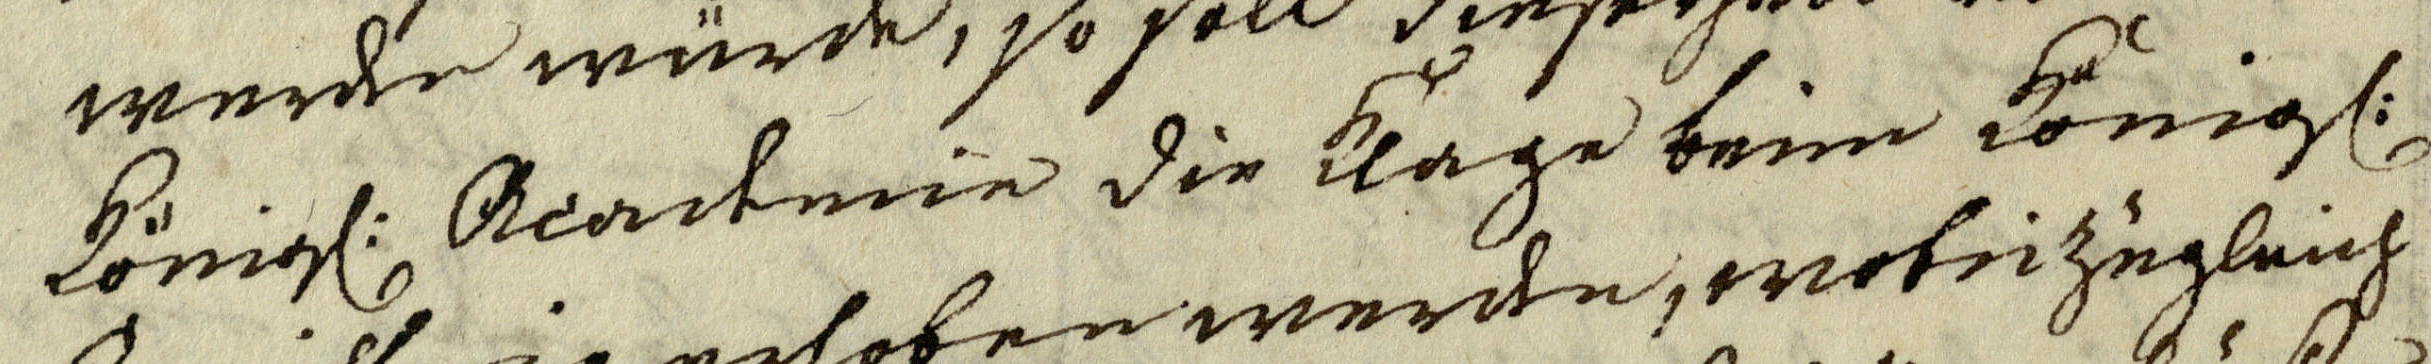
Königl. Academie die Klage beim Königl.
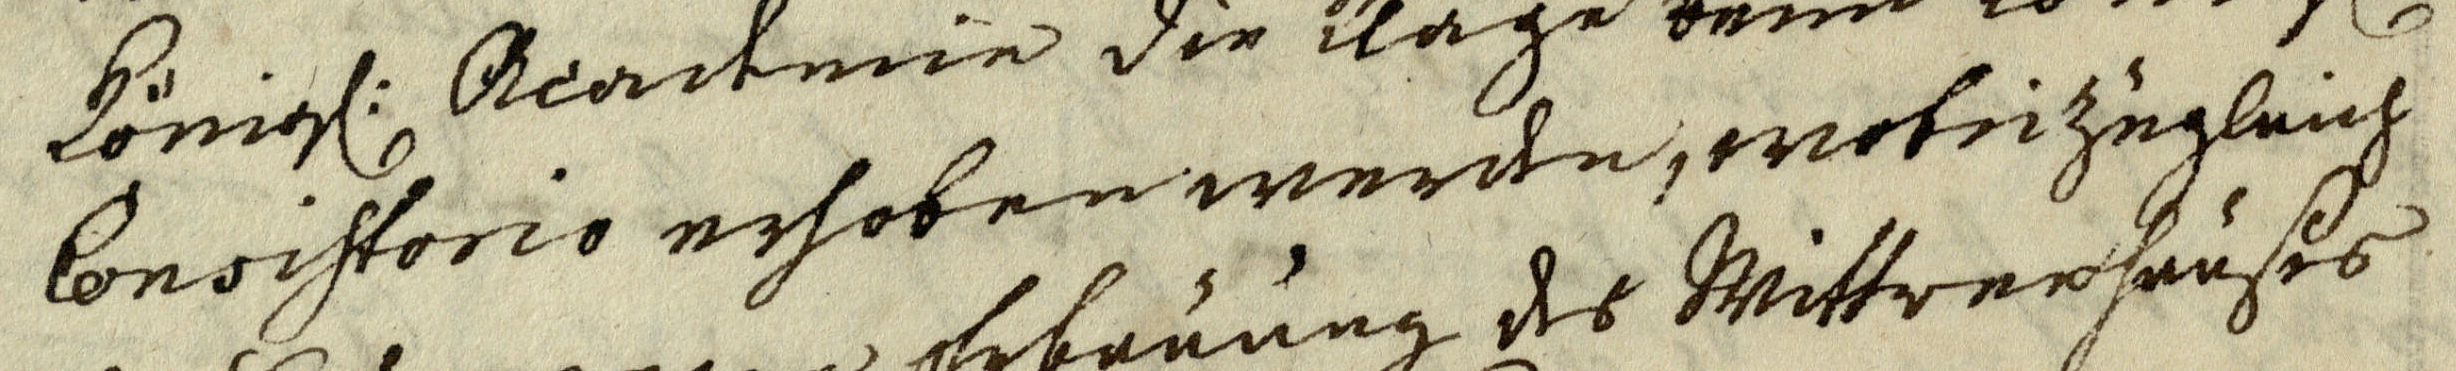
Consistorio erhoben werden, wobei zugleich
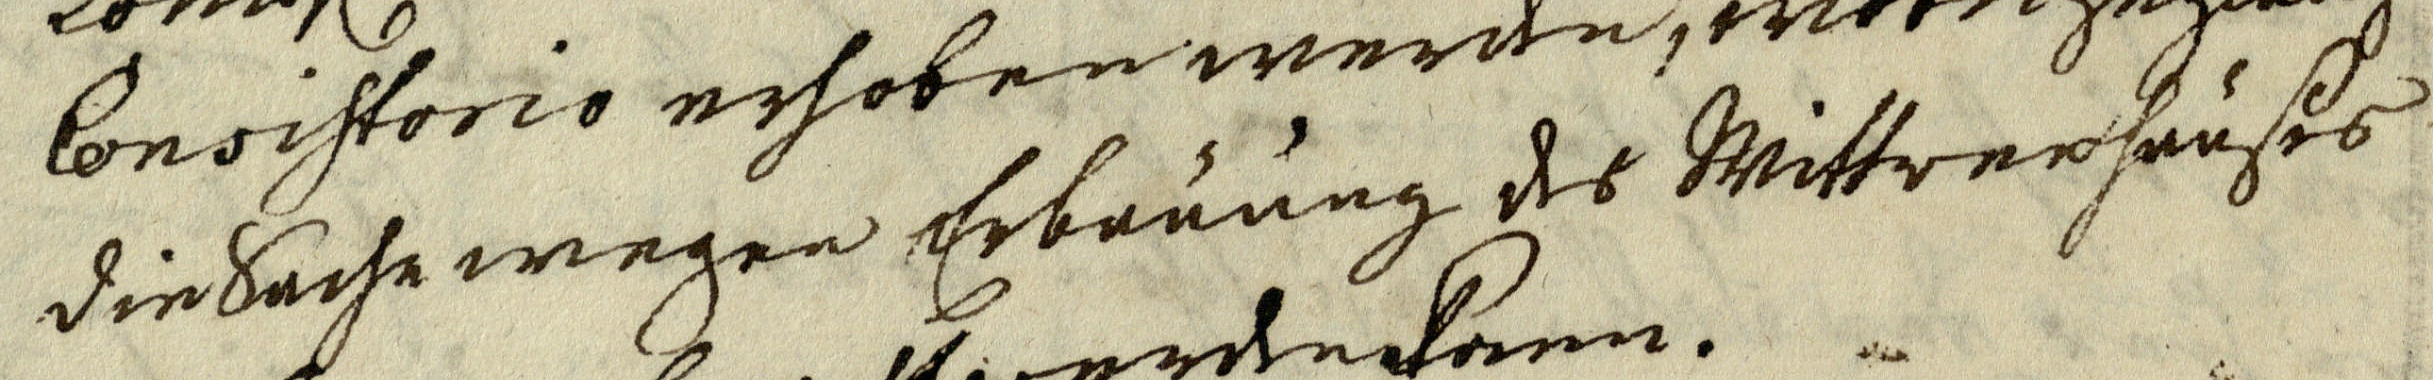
die Sache wegen Erbauung des Wittwenhauses
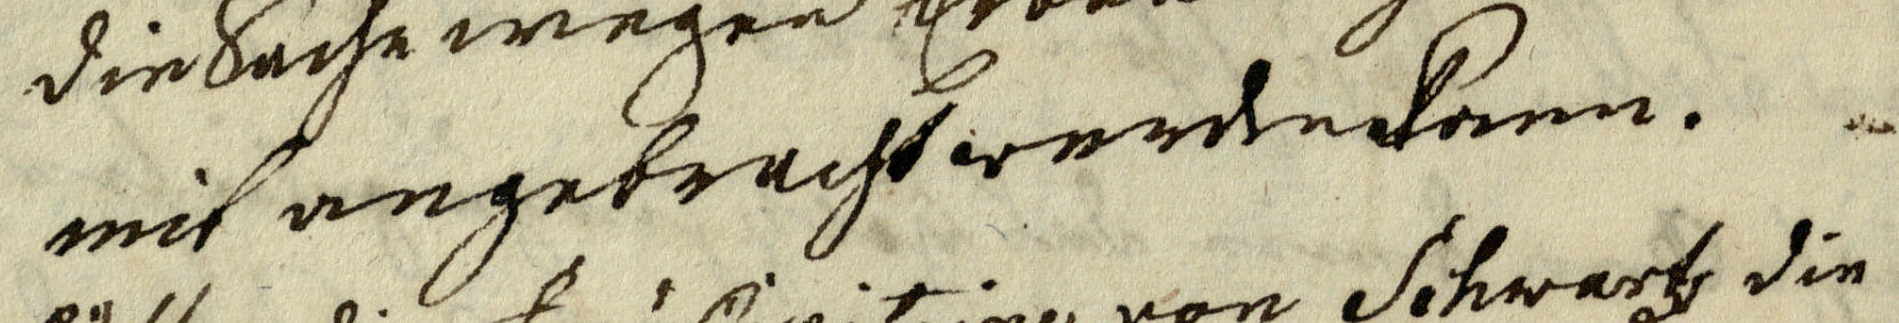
mit angebracht werden kann.
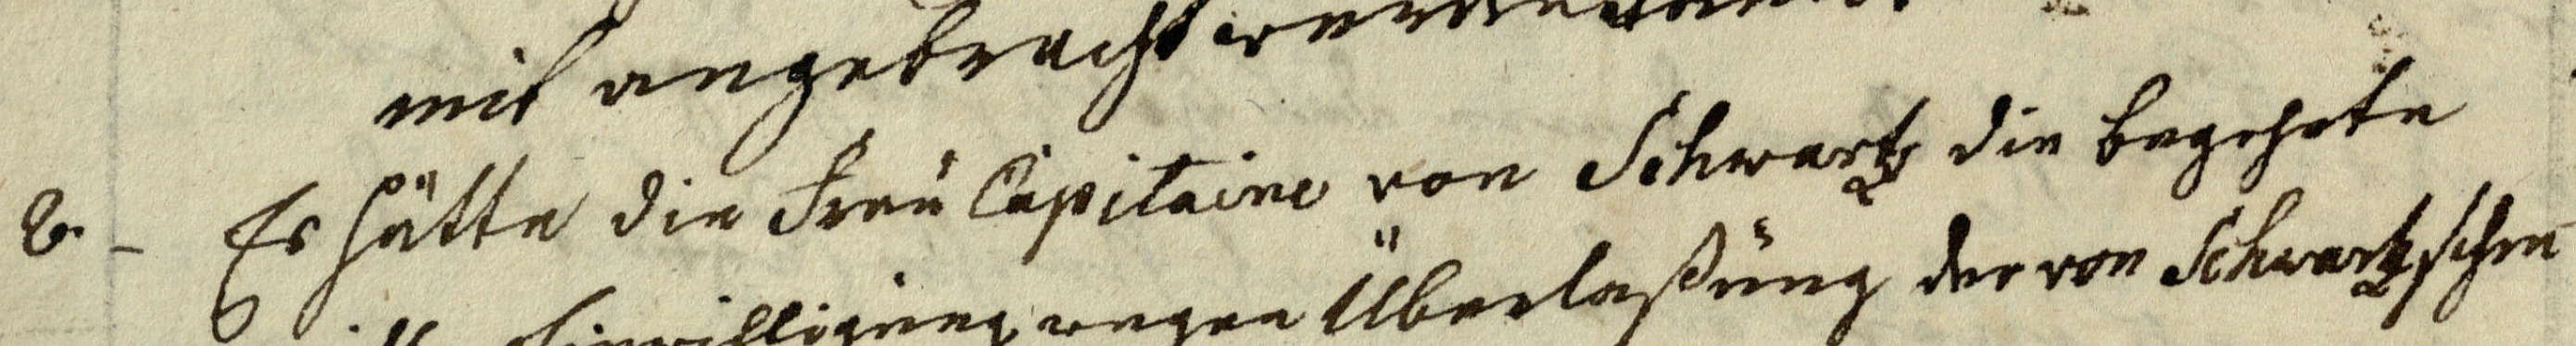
8. Es hätte die Frau Capitaine von Schwartz die begehrte
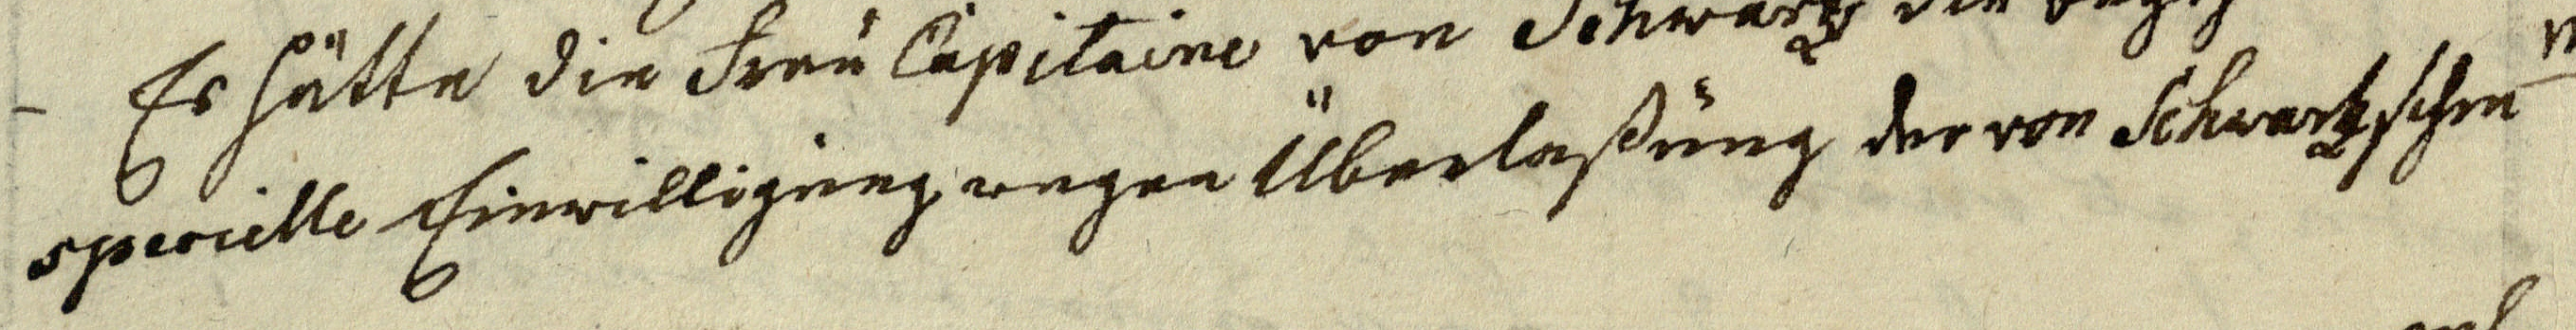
specielle Einwilligung wegen Überlaßung der von Schwartzschen
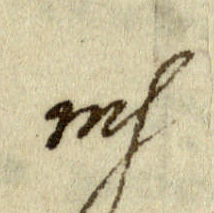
ms
